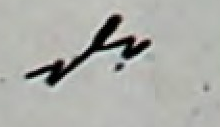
do
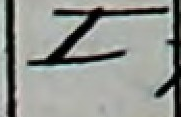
I
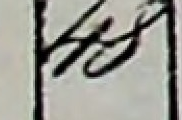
48
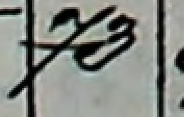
73
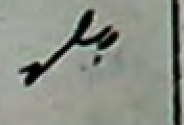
do
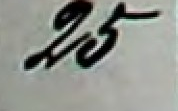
25
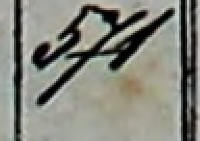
571
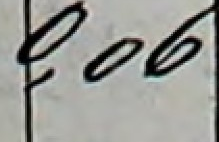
0,06
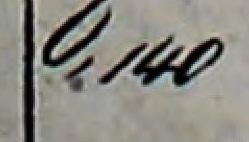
0,140
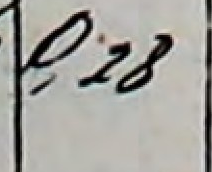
0,28
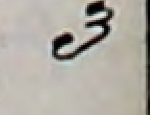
3
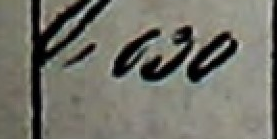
0,030
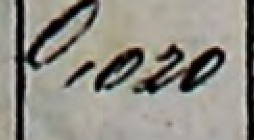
0,020
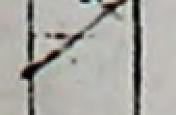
7
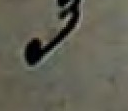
3
